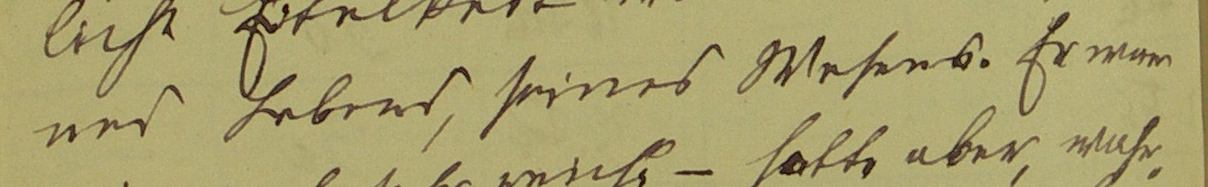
nes Lebens, seines Wesens. Er war
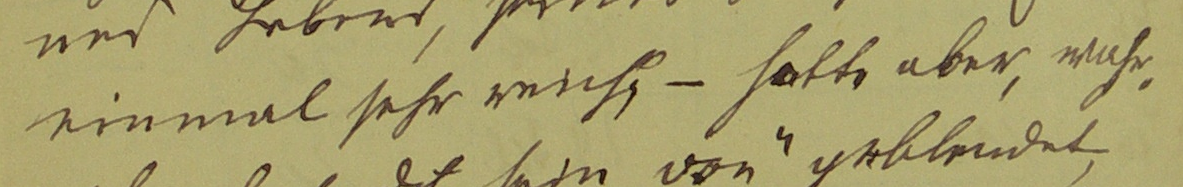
einmal sehr reich, - hatte aber, wahr¬
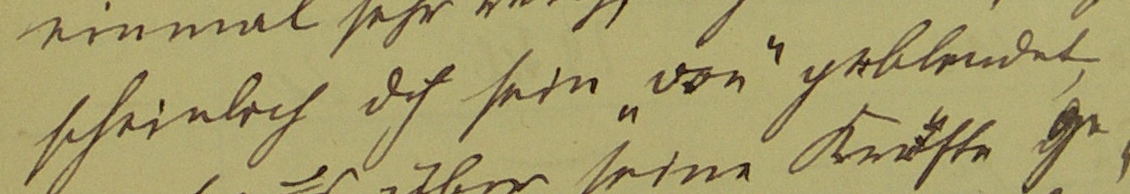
scheinlich durch sein „von“ geblendet,
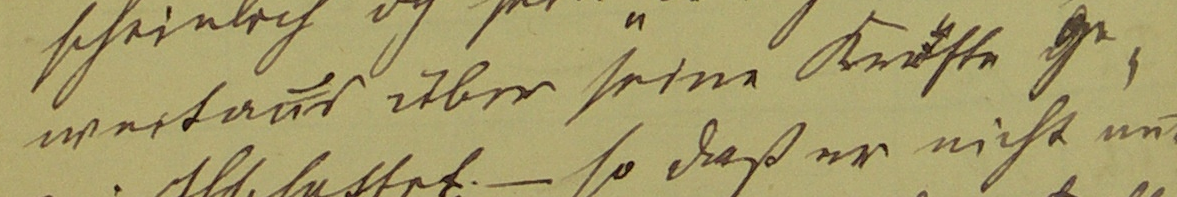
weitaus über seine Kräfte ge¬
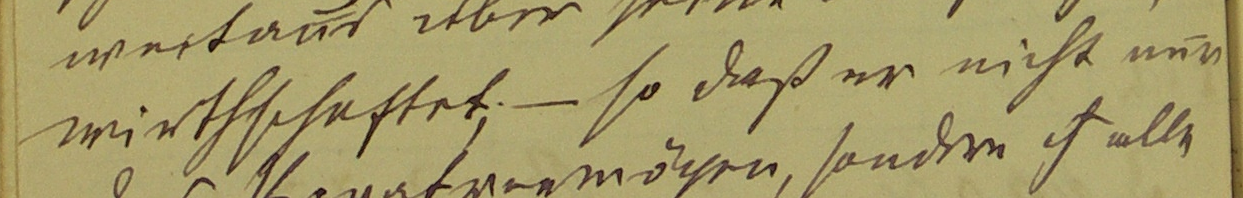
wirtschaftet; - so daß er nicht nur
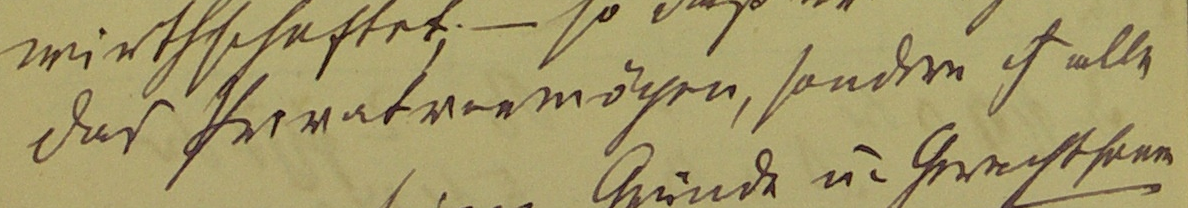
das Privatvermögen, sondern ??? alle
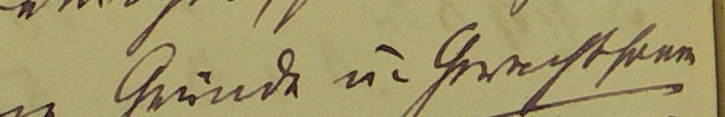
??? ??? Gründe und ???
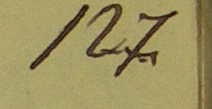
127
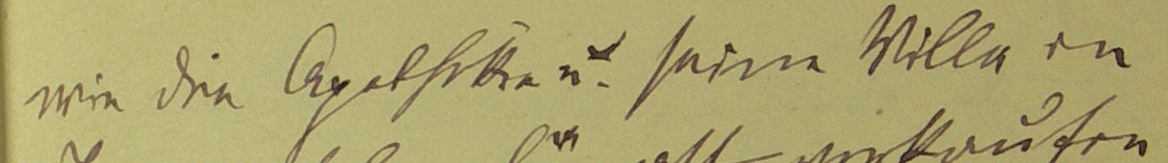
wie seine Apotheke und sein Villa in
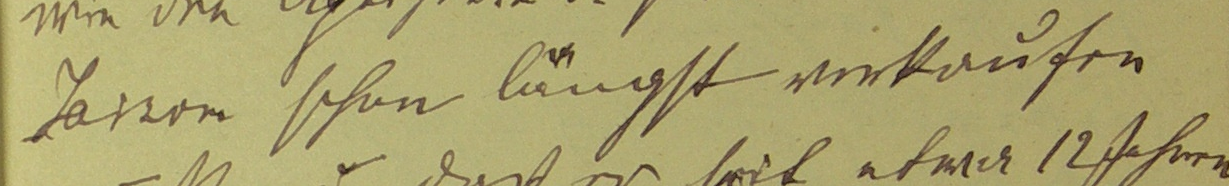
Zaizon schon längst verkaufen
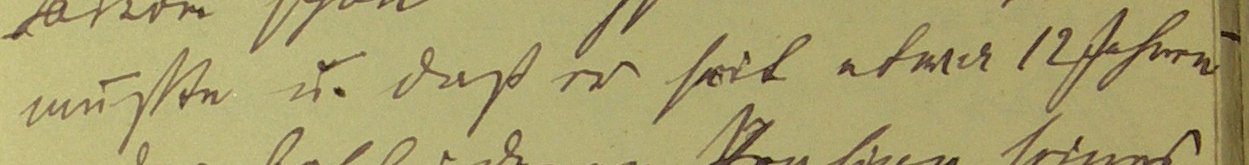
mußte u. das er seit etwa 12 Jahren
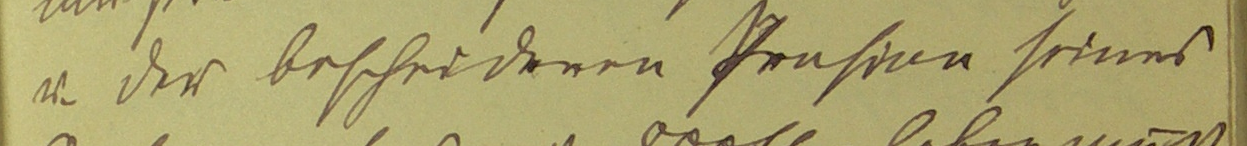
v. der bescheidenen Pension seines
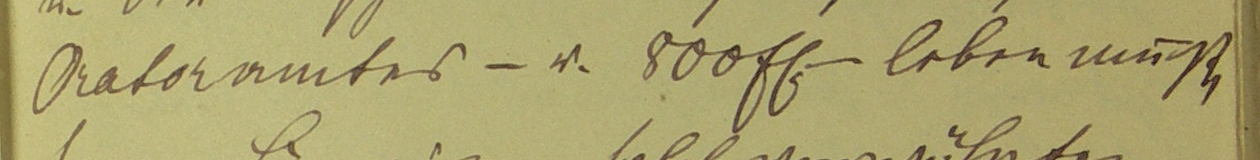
Notaramtes – v. 800 FF - leben muß¬
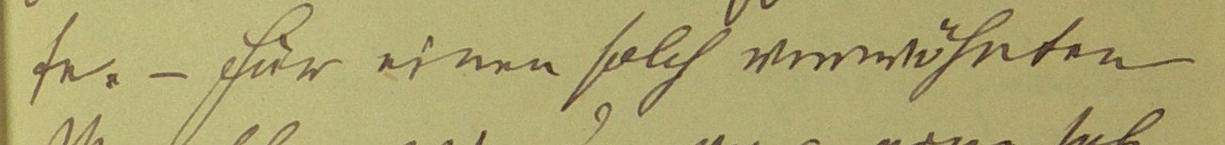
te. - Für einen solch verwöhnten
